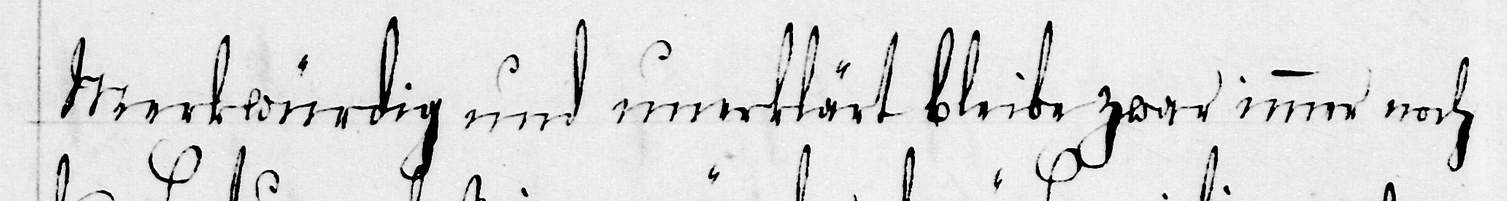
Merkwürdig und unerklärt bleibe zwar immer noch
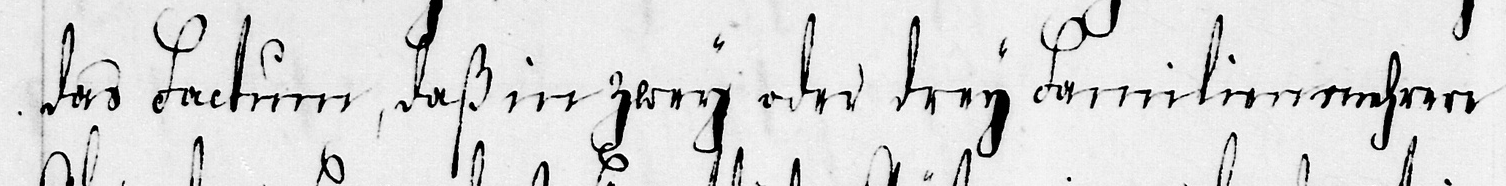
das Factum, daß in zwey oder drey Familien mehrere
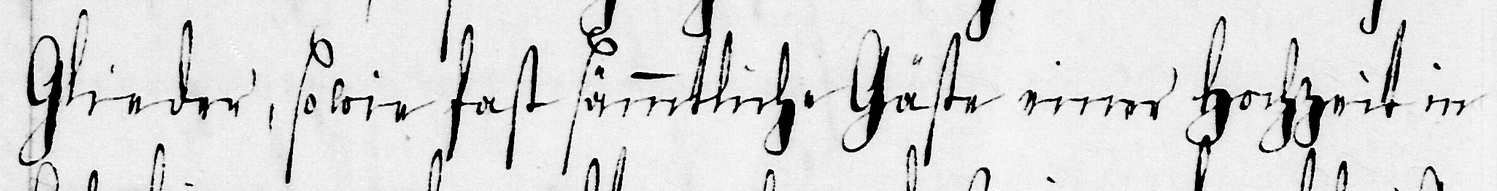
Glieder, sowie fast sämmtliche Gäste einer Hochzeit in
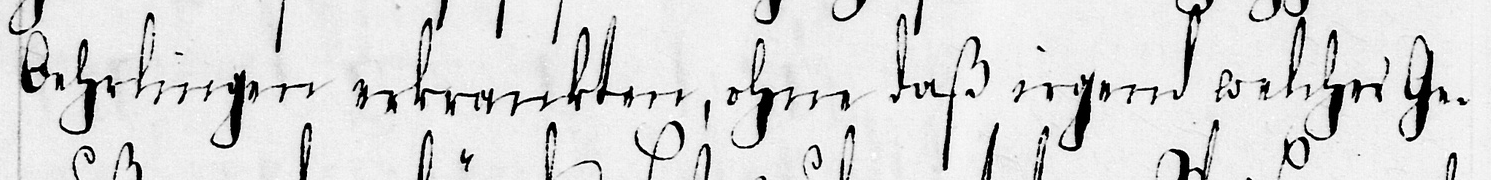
Oehrlingen erkrankten, ohne daß irgend welcher Ge¬
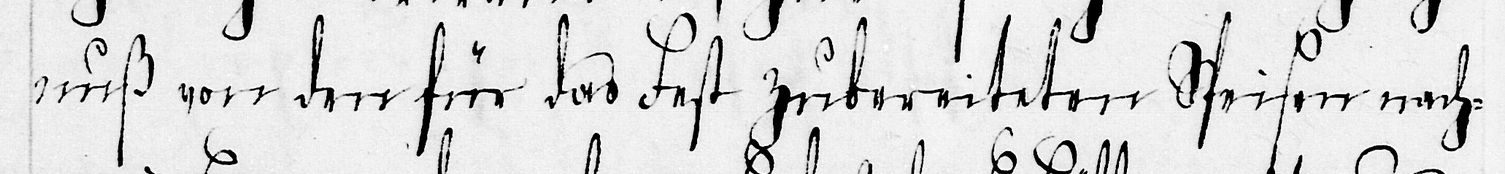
nuß von den für das Fest zubereiteten Speisen nach¬
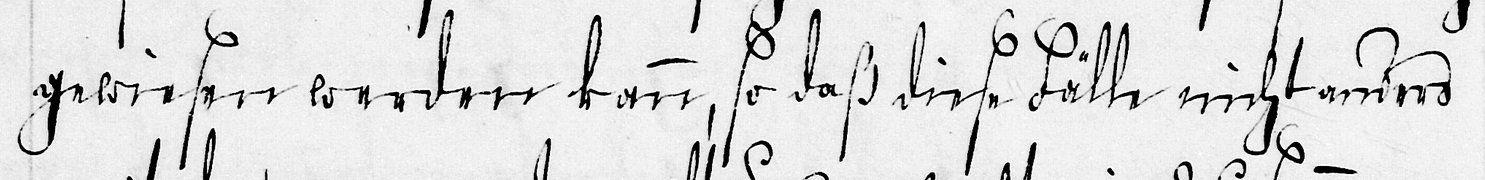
gewiesen werden kann, so daß diese Fälle nicht anders
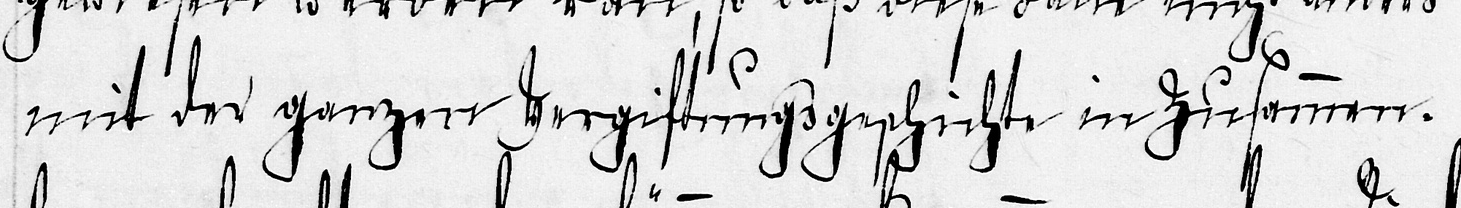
mit der ganzen Vergiftungsgeschichte in Zusammen¬
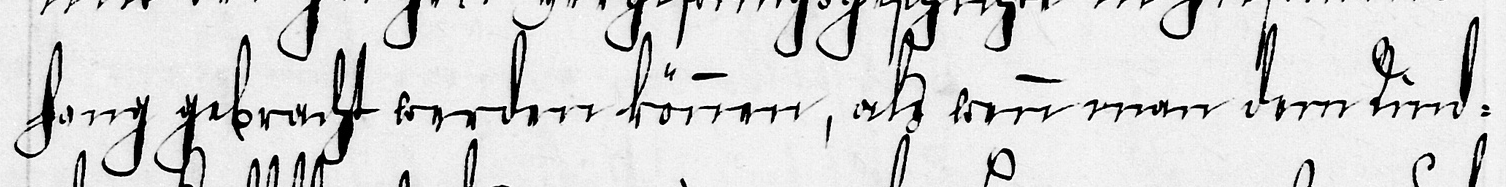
hang gebracht werden können, als wenn man dem Rind-
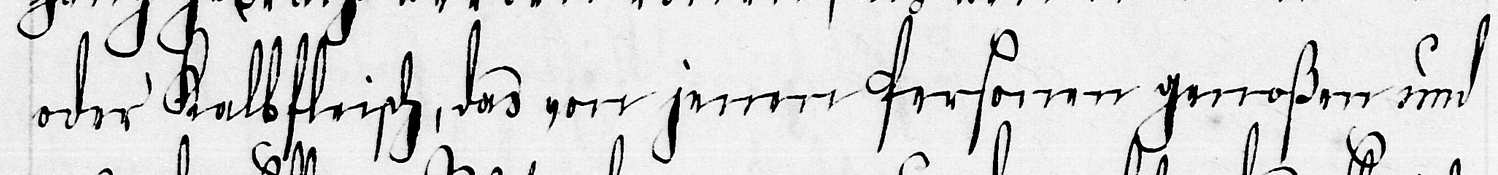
oder Kalbfleisch, das von jenen Personen genoßen und
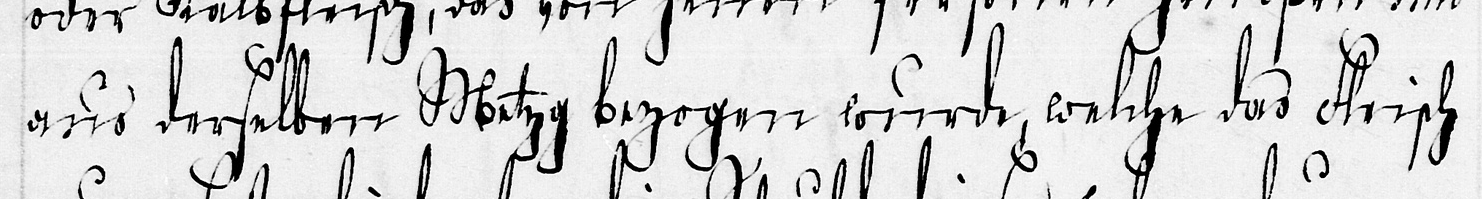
aus derselben Metzg bezogen wurde, welche das Fleisch
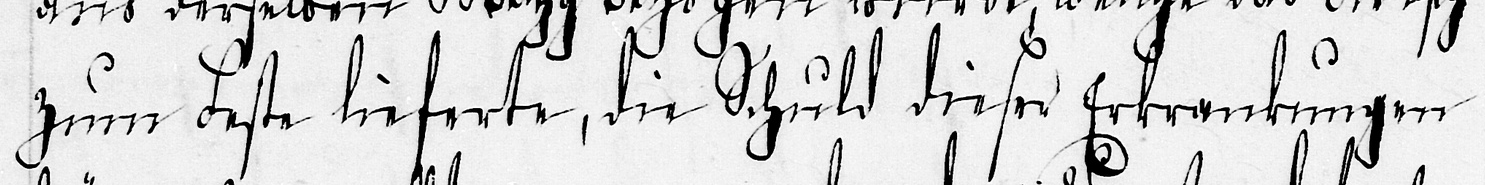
zum Feste lieferte, die Schuld dieser Erkrankungen
